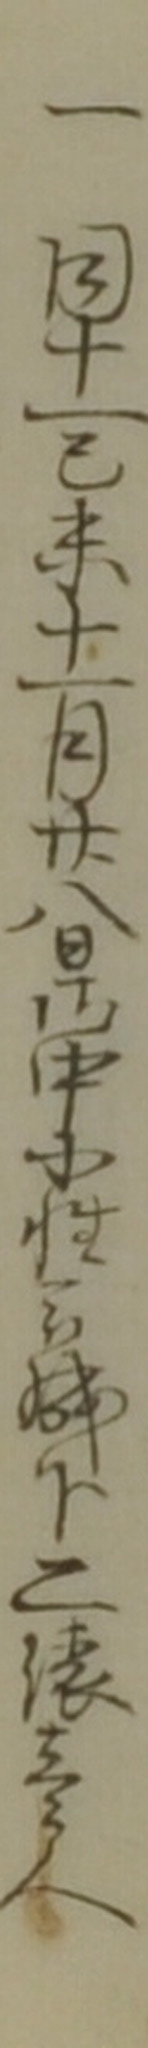一同十一己未十一月廿八日御中小性被成下二俵壱人
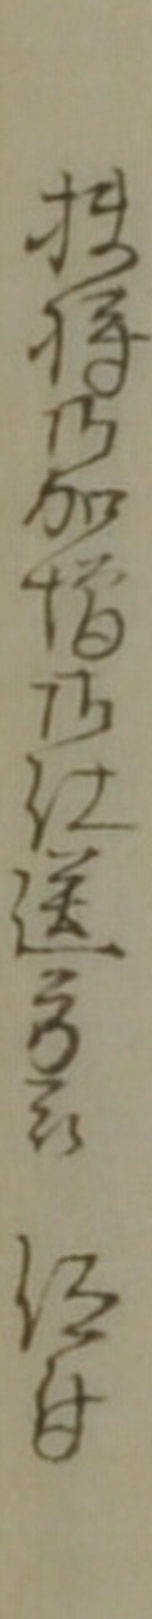扶持御加増御仕送方被仰付
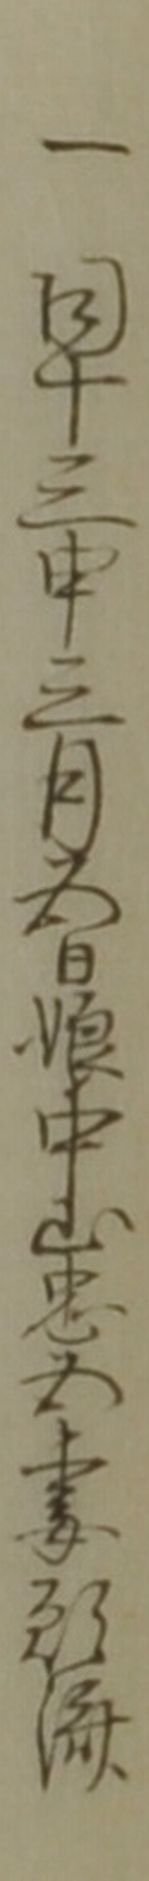一同十三甲三月五日娘中山忠五妻願済
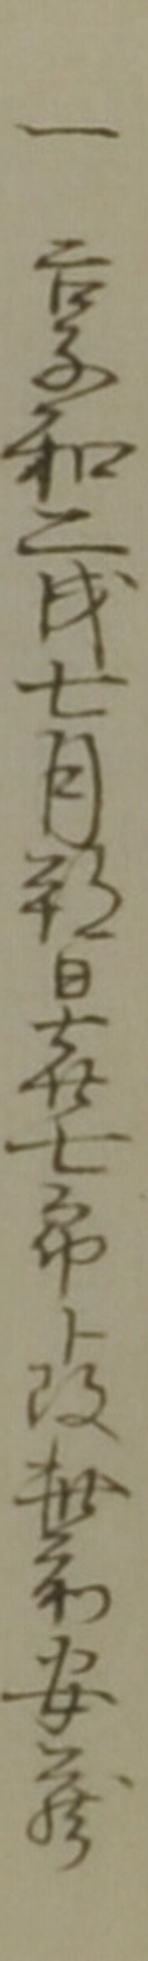一享和二戌七月朔日喜七郎ト改此前安蔵
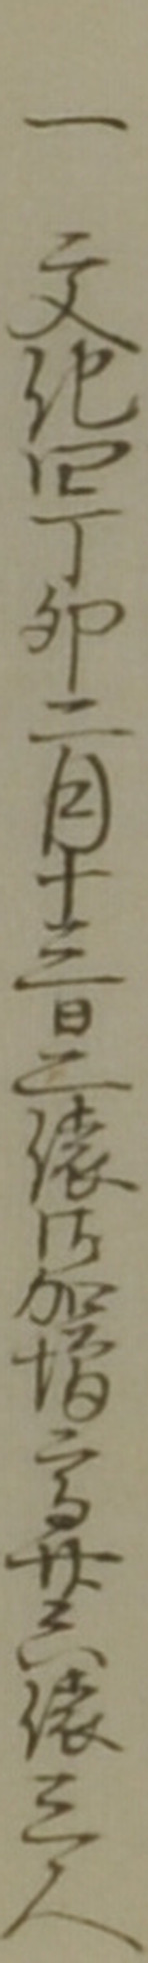一文化四丁卯二月十三日二俵御加増高六俵三人
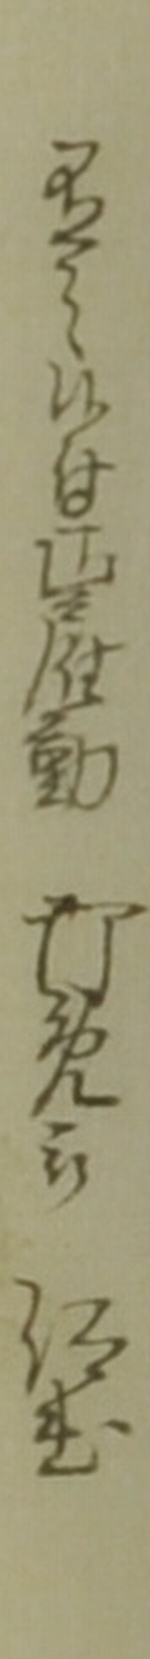有之候付御雇勤御免被仰出

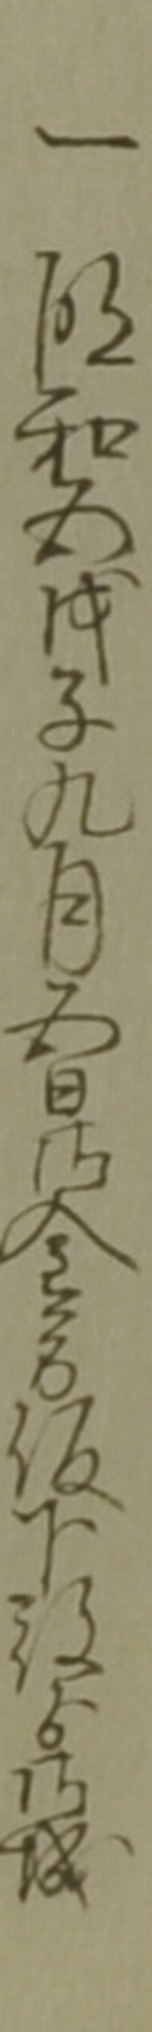一明和五戊子九月五日御金方仮下役ゟ御城
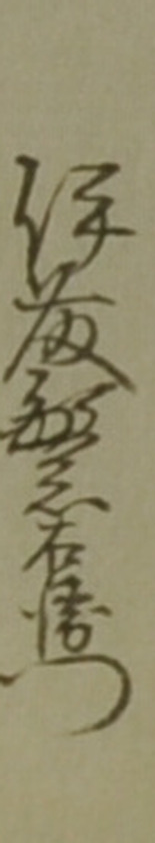伊藤繁右衛門
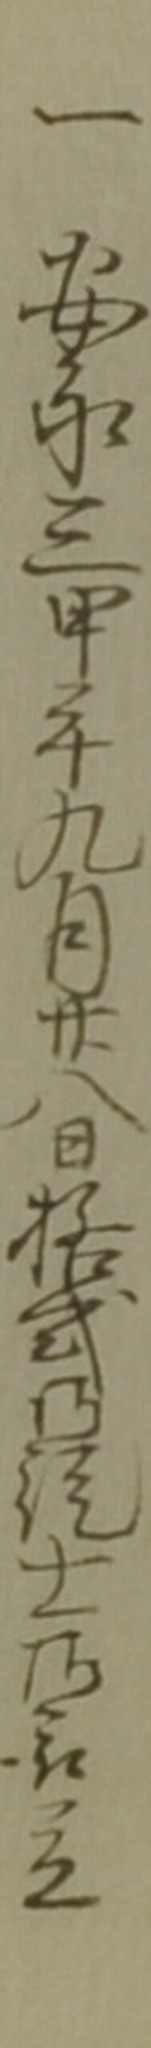一安永三甲午九月廿八日格式御徒士御取立
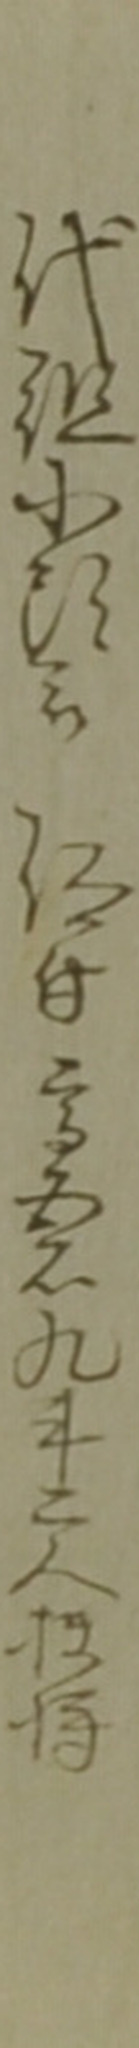代組小頭被仰付高五石九斗二人扶持
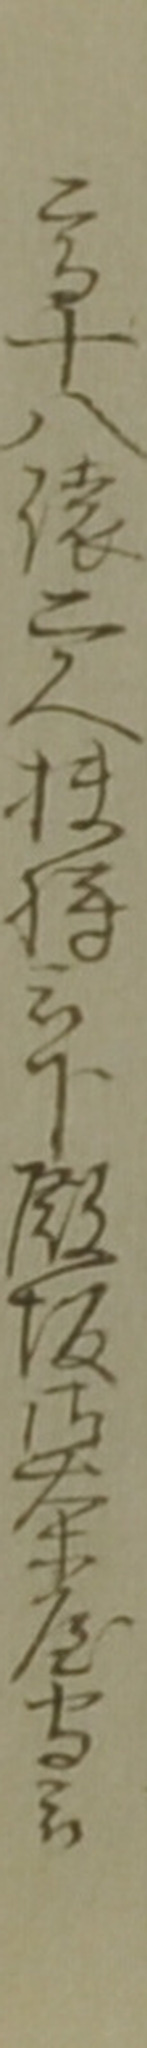高十八俵二人扶持被下殿坂御茶屋守被
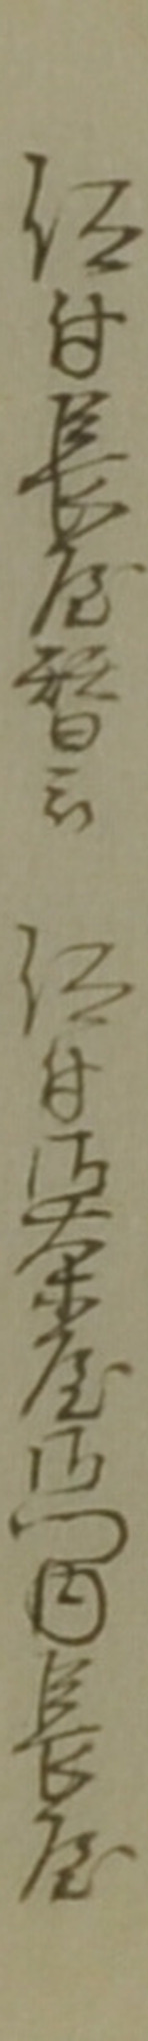仰付長屋替被仰付御茶屋御門内長屋
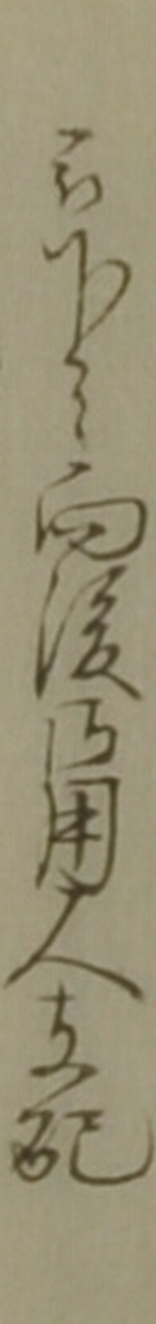被下之向後御用人支配
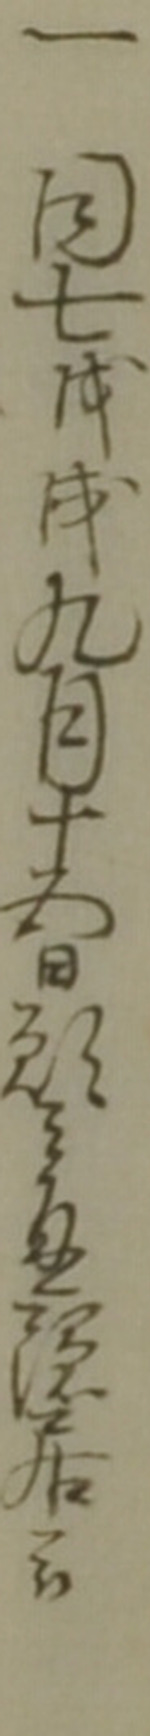一同七戊戌九月十五日願之通隠居被
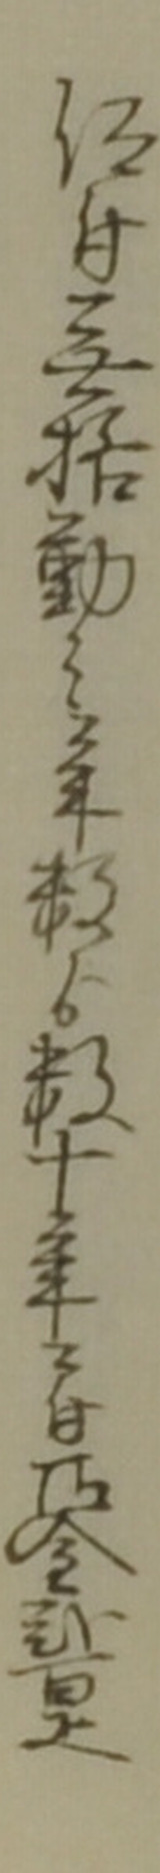仰付無格勤之年数ゟ数十年ニ付御金弐百文
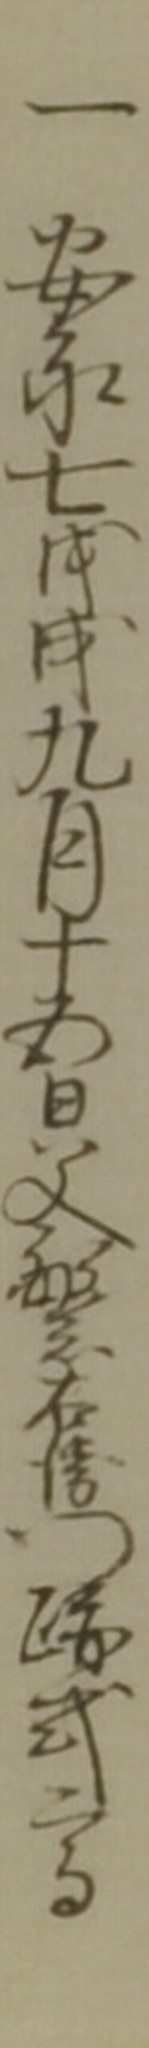一安永七戊戌九月十五日父繁右衛門跡式高
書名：無足廃家（壱）
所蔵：伊那市立高遠町図書館・合同会社AMANE
